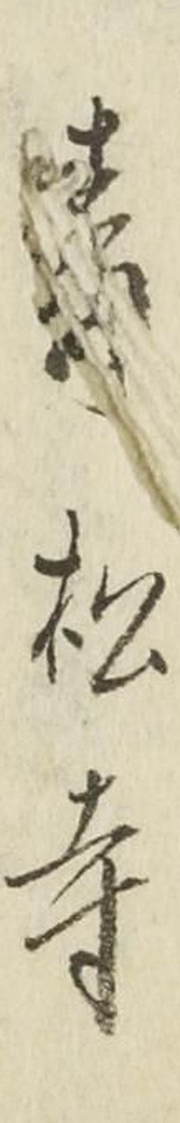青松寺
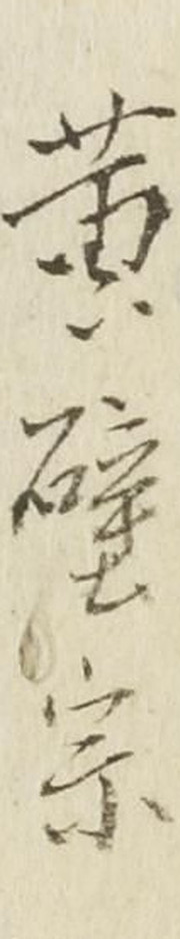黄檗宗
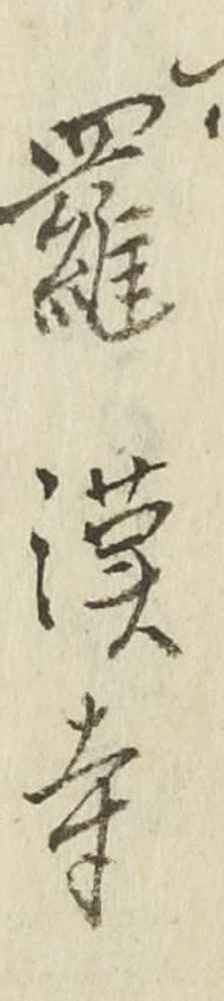羅漢寺
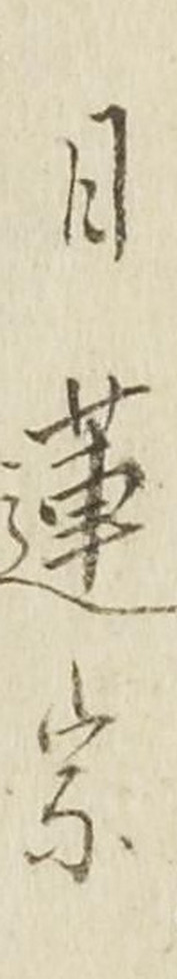日蓮宗
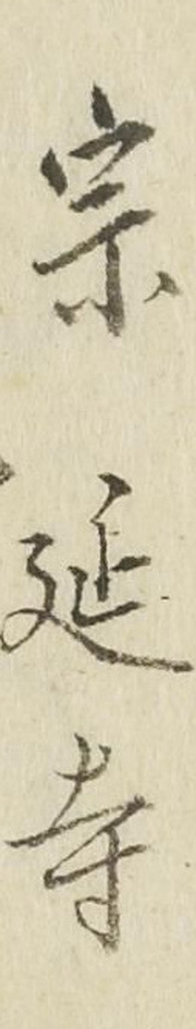宗延寺
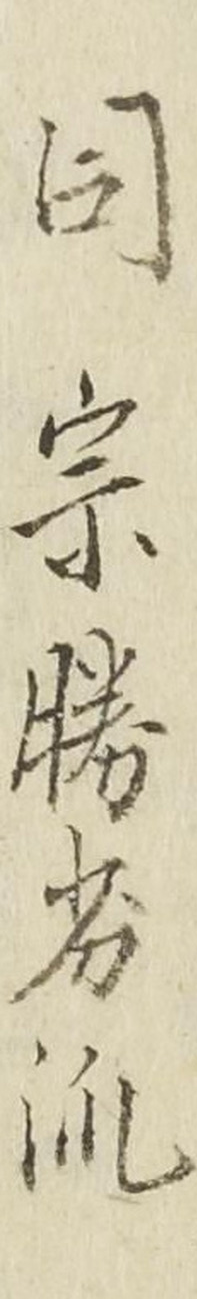同宗勝劣派
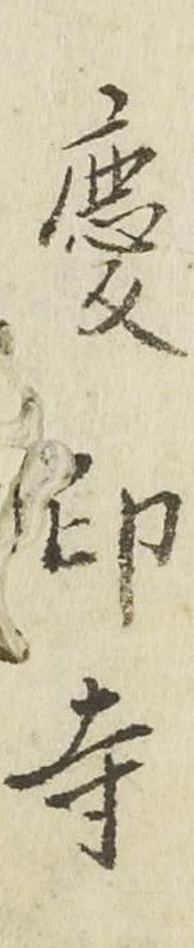慶印寺
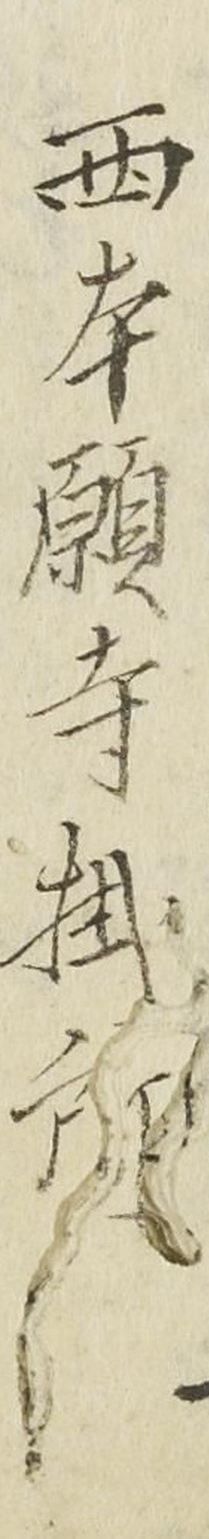西本願寺掛所
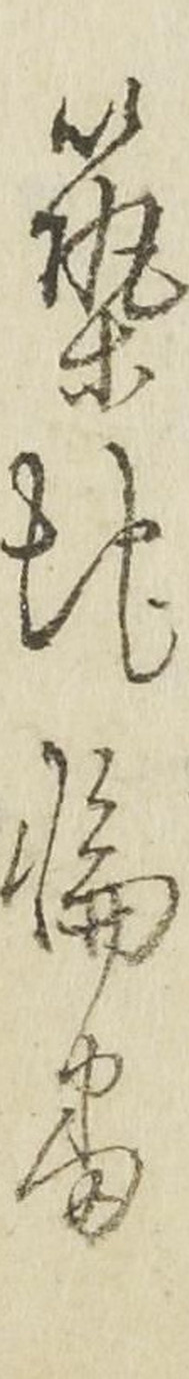築地輪番
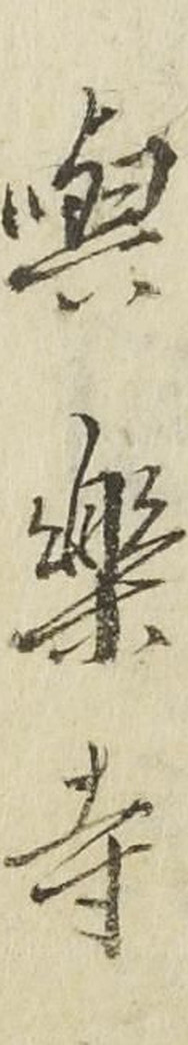與楽寺
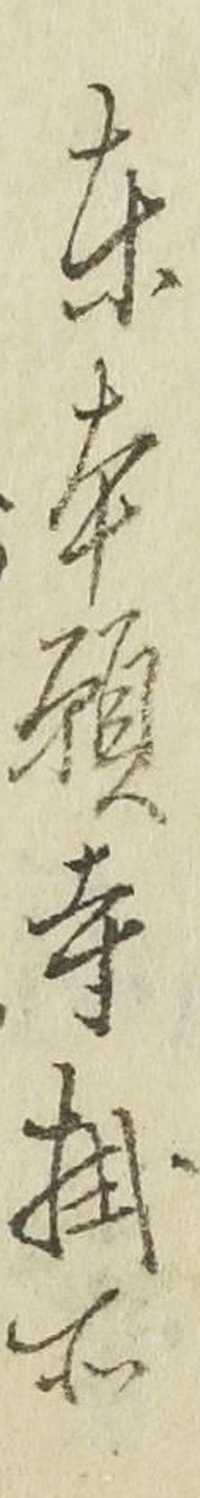東本願寺掛所
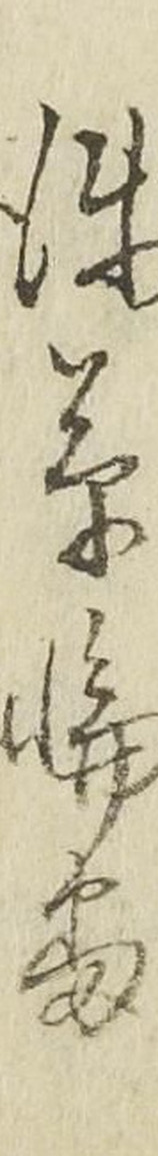浅草輪番
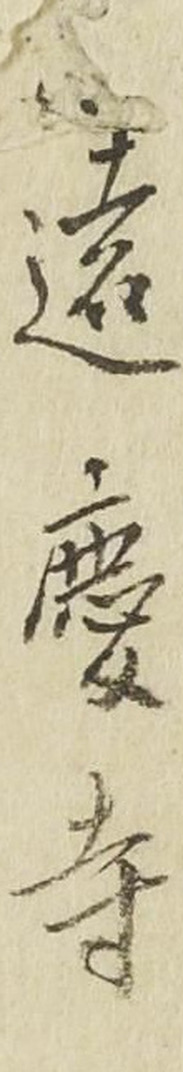遠慶寺

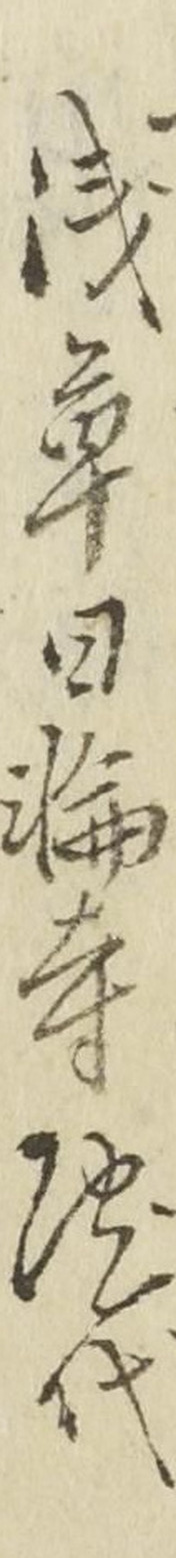浅草日輪寺院代
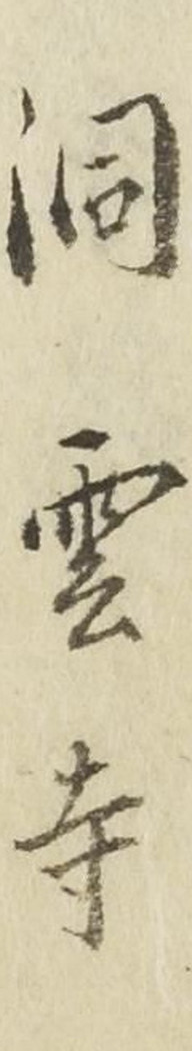洞雲寺
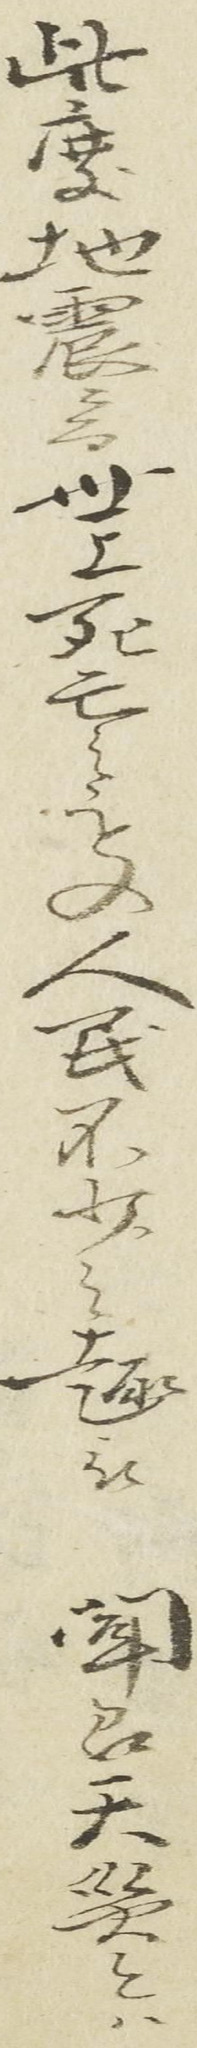此度地震にて世上死亡之もの人民不少之趣被聞召天災とは
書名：安政二乙卯年十月二日大地震之事
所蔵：東京大学地震研究所図書室 Earthquake Research Institute Library, The University of Tokyo, JAPAN
